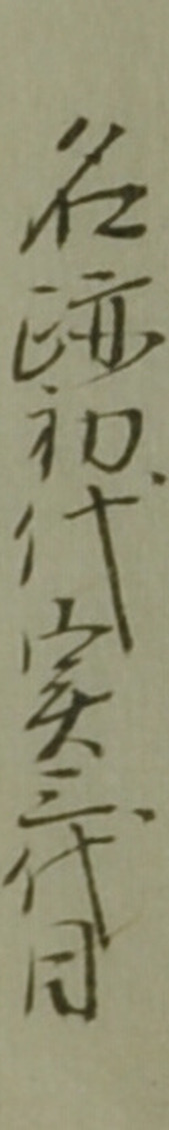名跡初代実三代目
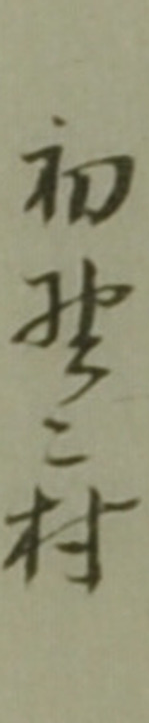初野々村
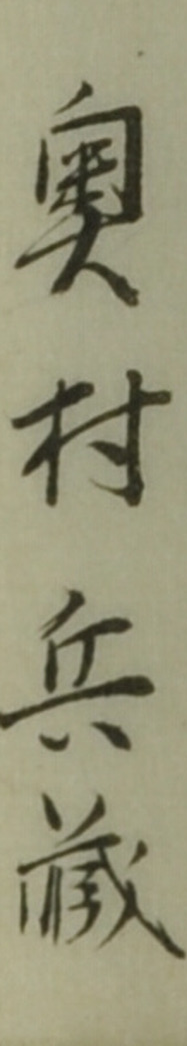奥村兵蔵

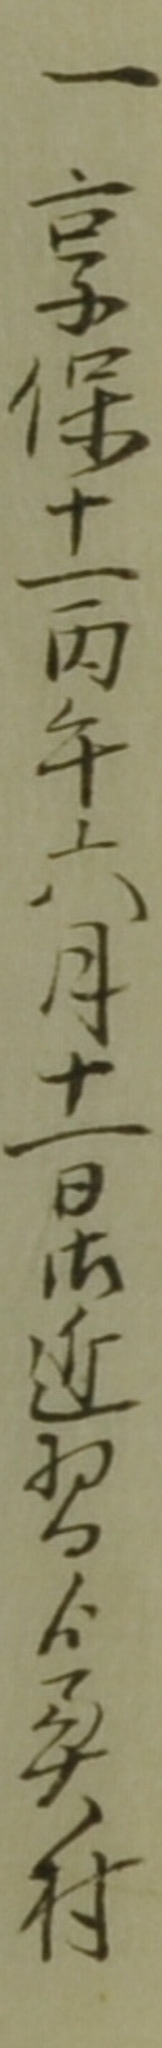一享保十一丙午六月十一日御近習ゟ奥村
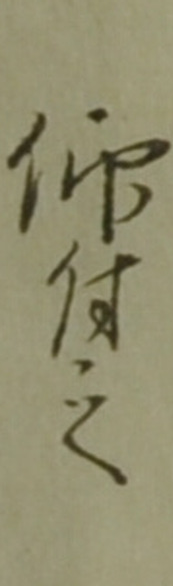仰付之
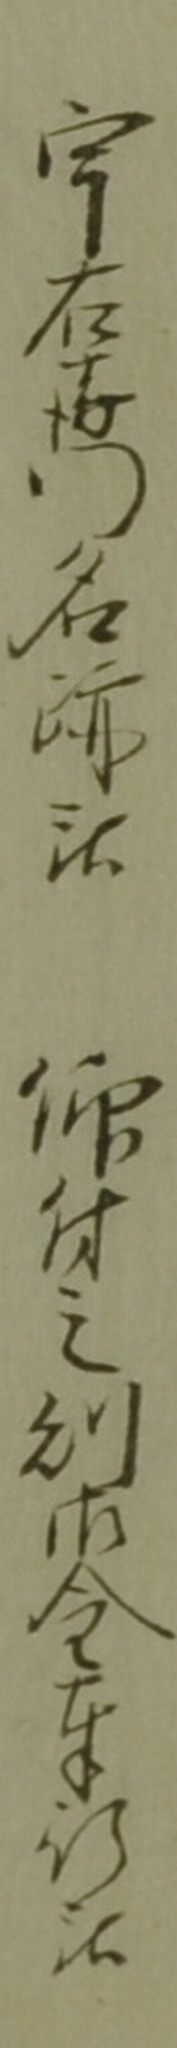宇右衛門名跡被仰付之則御金奉行被
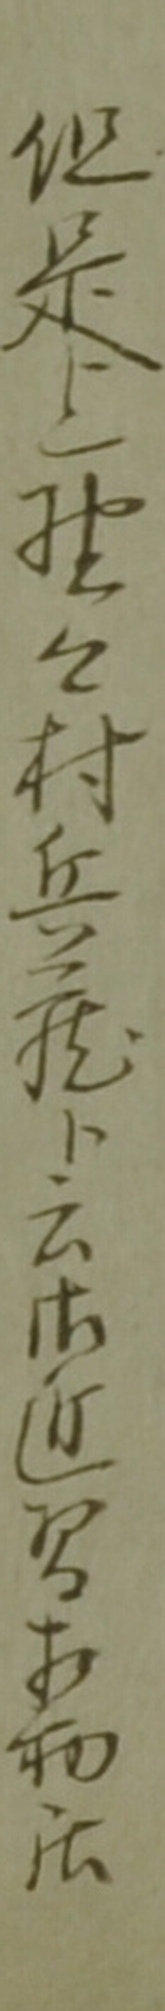但是迄野々村兵蔵云御近習相
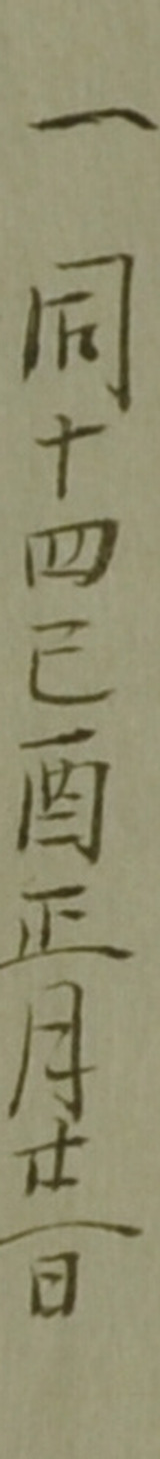一同十四己酉正月廿一日
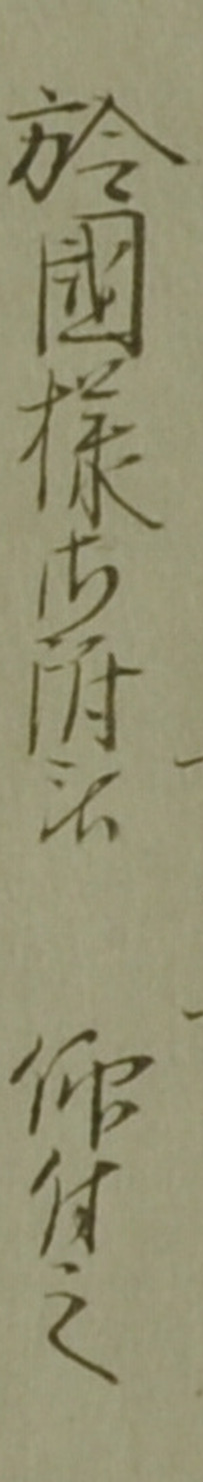於国様御附被仰付之
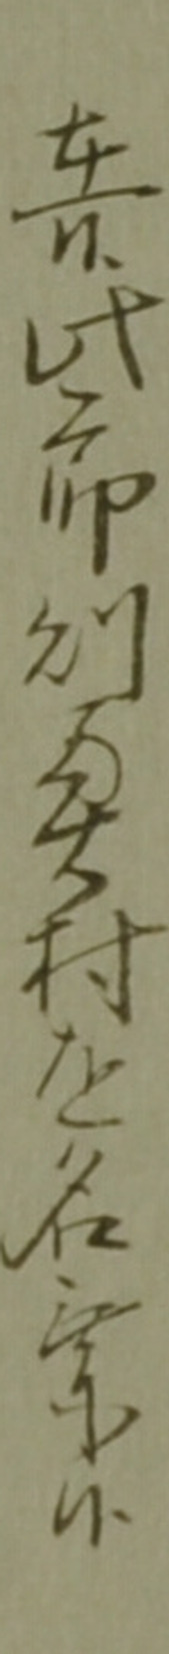在候此節則奥村を名乗候
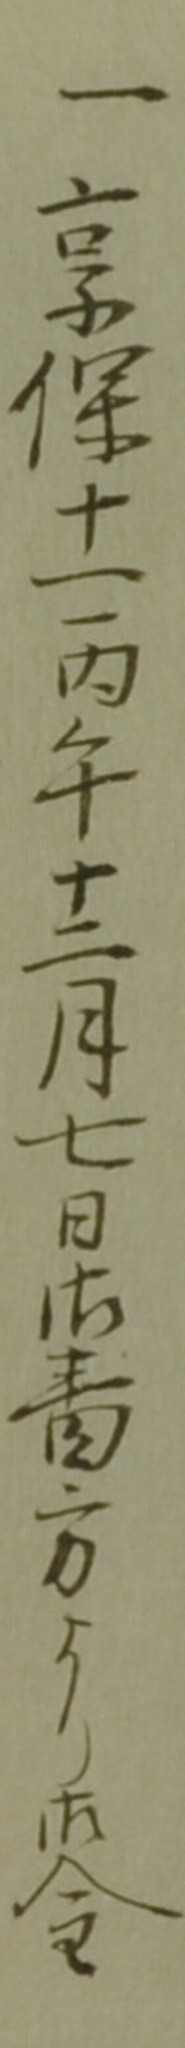一享保十一丙午十二月七日御番方より御金
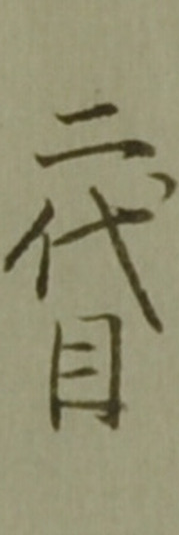二代目
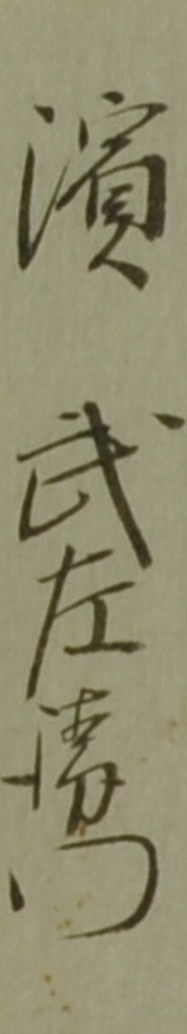濱武左衛門
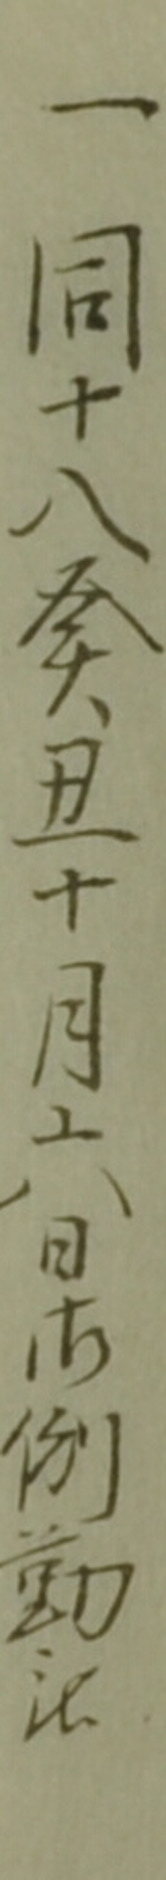一同十八癸丑十月六日御側勤被
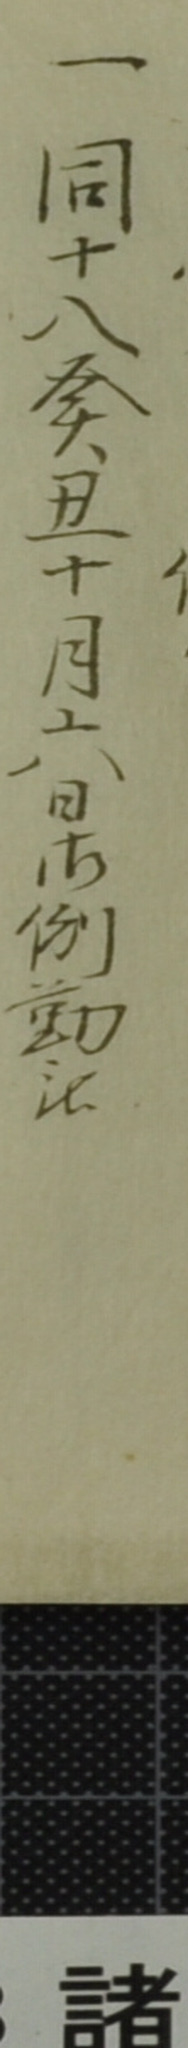一同十八癸丑十月六日御側勤被
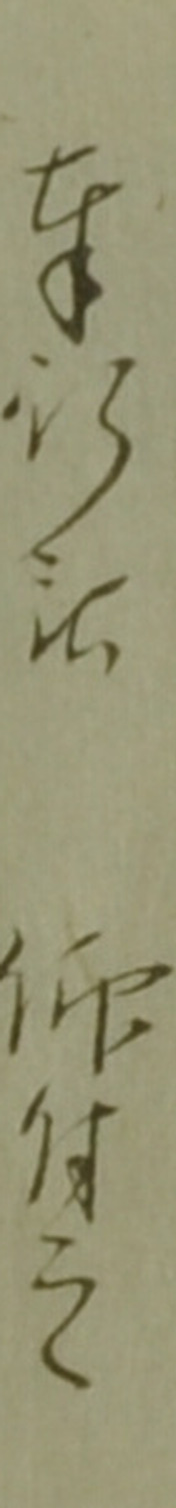奉行被仰付之
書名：諸御役代々録（七）
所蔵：伊那市立高遠町図書館・合同会社AMANE
